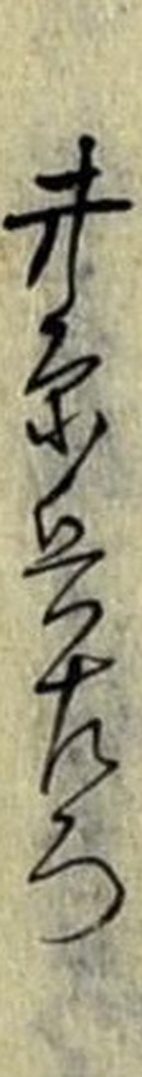井原兵左衛門
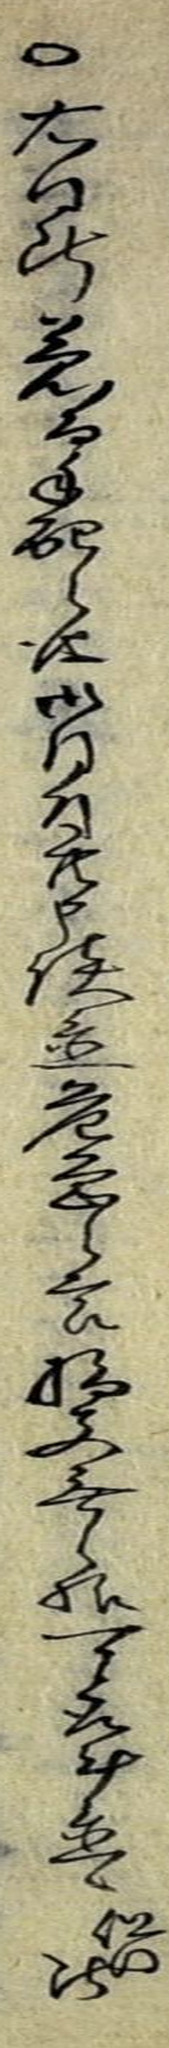〇右同断兼而手配之儀御目付共申談置危急之節指支無之様可取計置候但同断
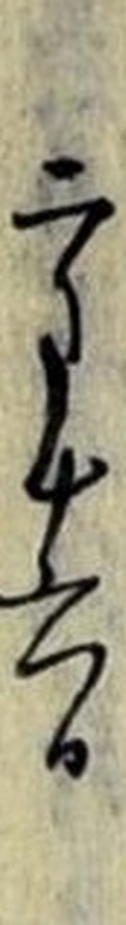二月十六日
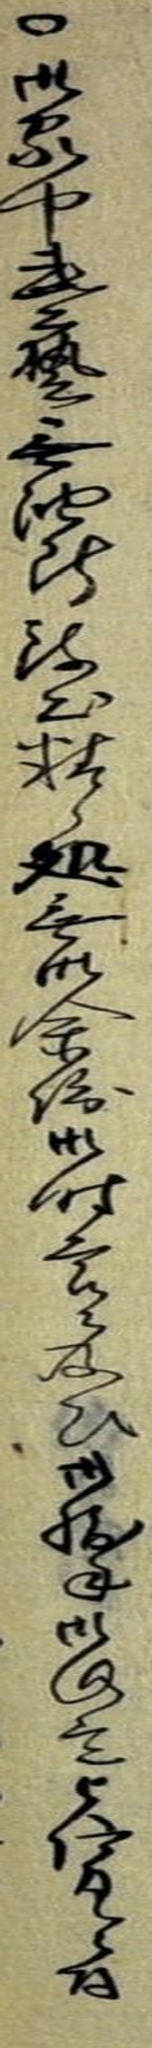〇御家中武芸無油断致出精候処無御余儀御時節ニ及ひ御勝手御趣意被仰付候ニ付
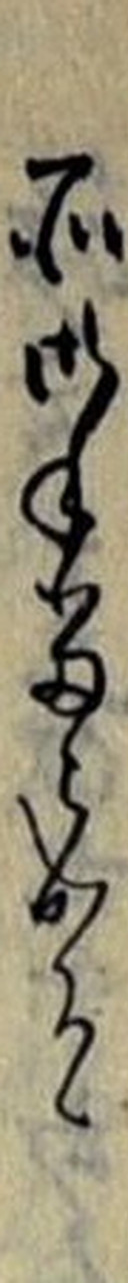所御手当被成下候
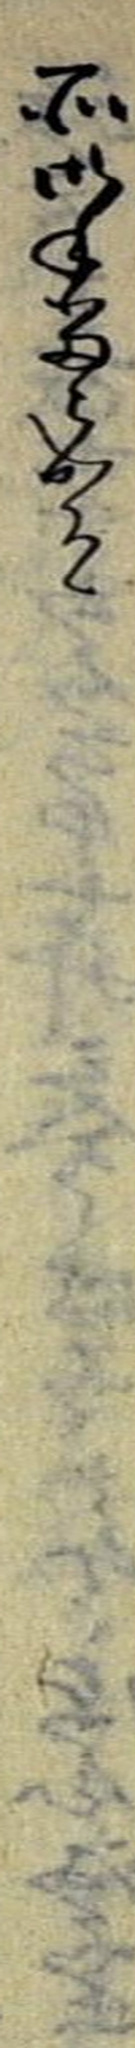所御手当被成下候
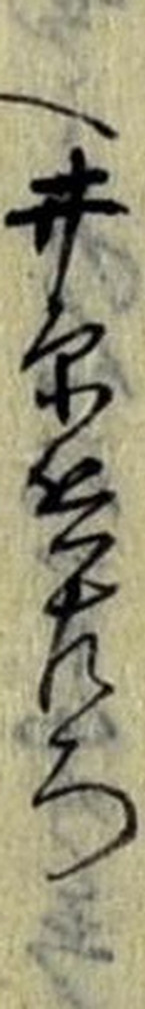井原兵左衛門
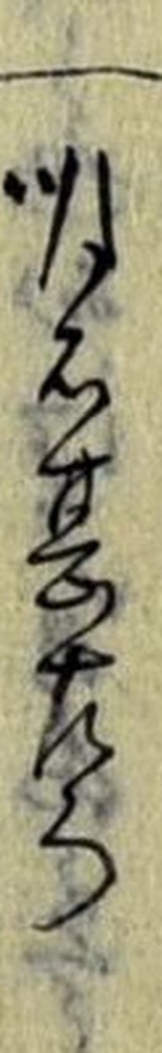明石甚左衛門
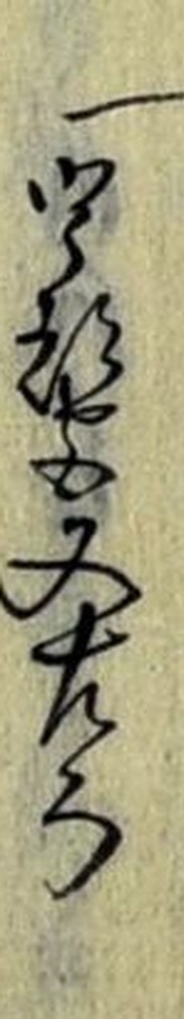宇都宮又左衛門
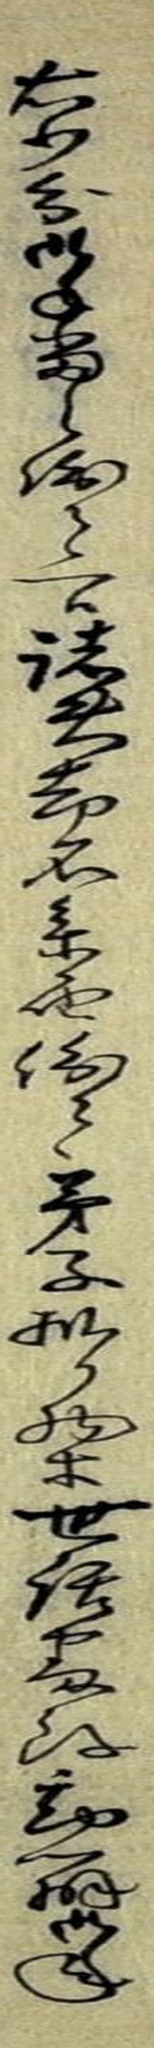右少分御手当之儀ニ候ヘハ諸失却不参届儀ニ候弟子掛り物等世話番役勘弁御年
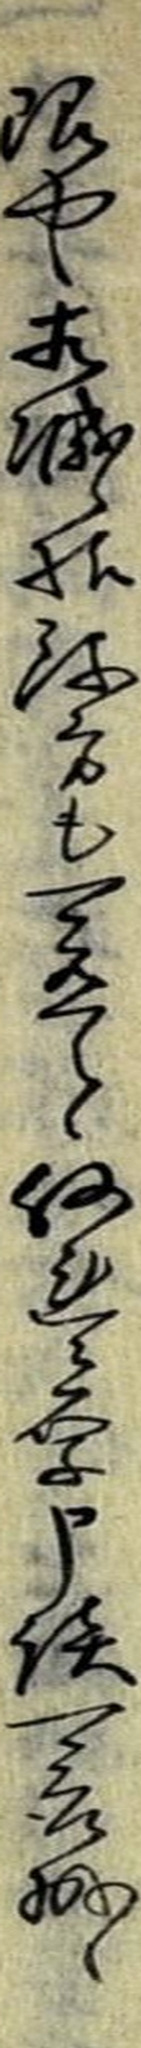限中相減候様致方も可有之候何連ニ厚申談可取扱候
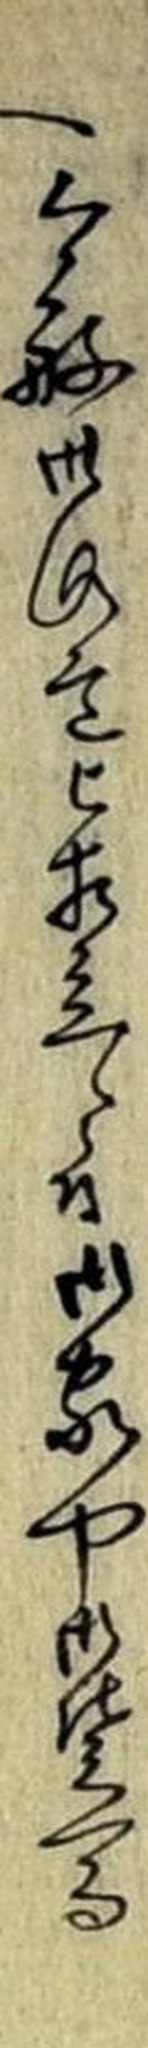今般御趣意被相立候ニ付御家中御貸馬
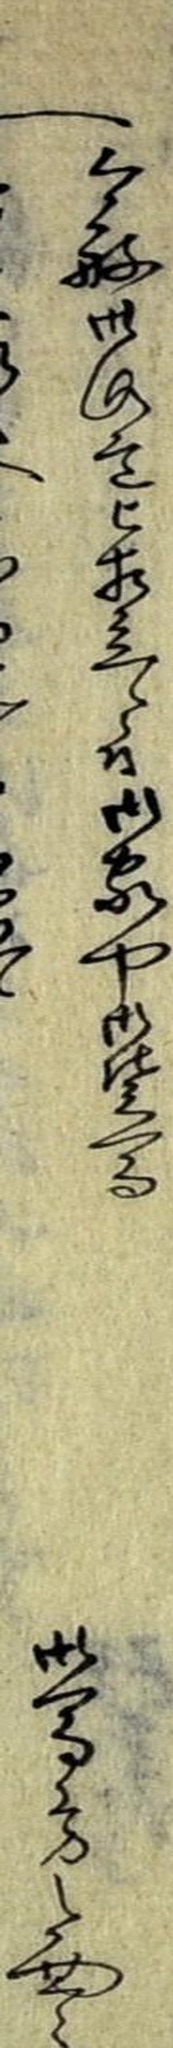今般御趣意被相立候ニ付御家中御貸馬
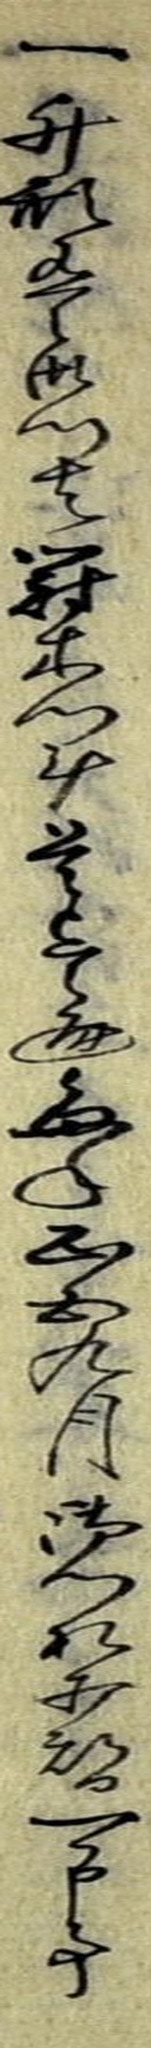一升形有之御門者冠木門斗是迄之通毎年正五九月御門札打替可申事
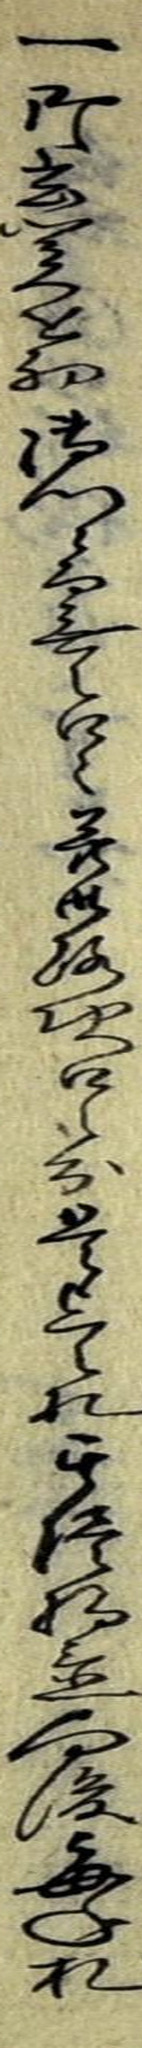一御玄関を初御門ニ而無之口々并御路次口之分是迄之札其儘指置向後毎年札
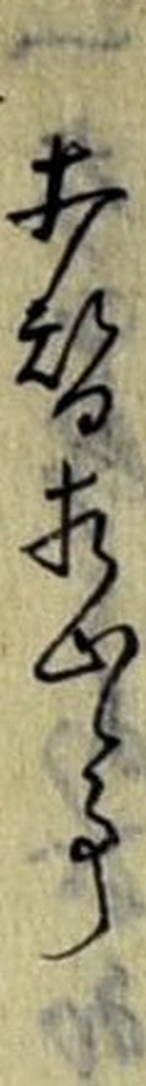打替相止候事
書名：命令之部 三
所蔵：福井県文書館 Fukui Prefectural Archives
